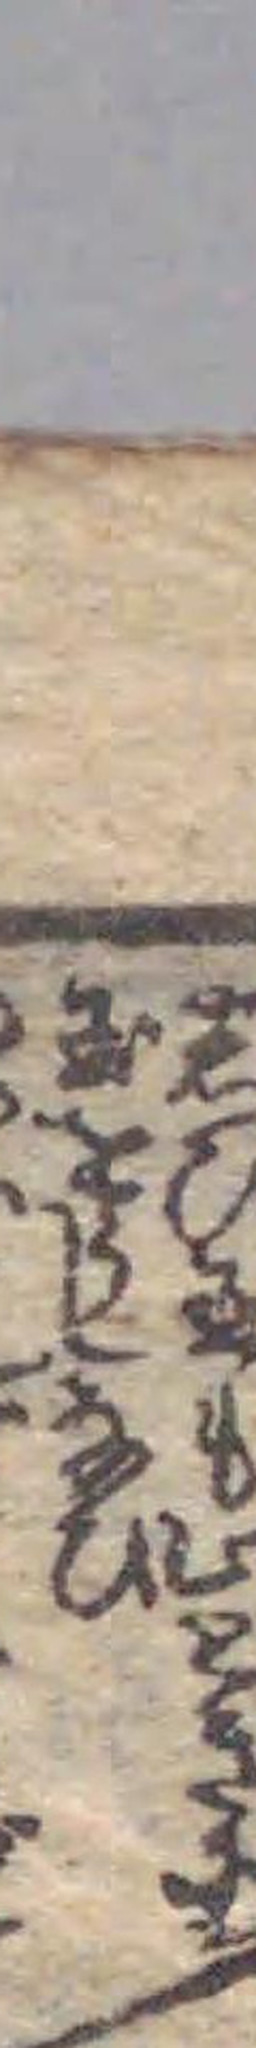玉をうしなひ
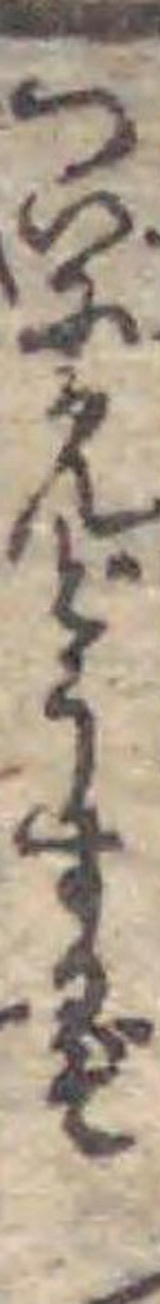ついにかんどうするぞ
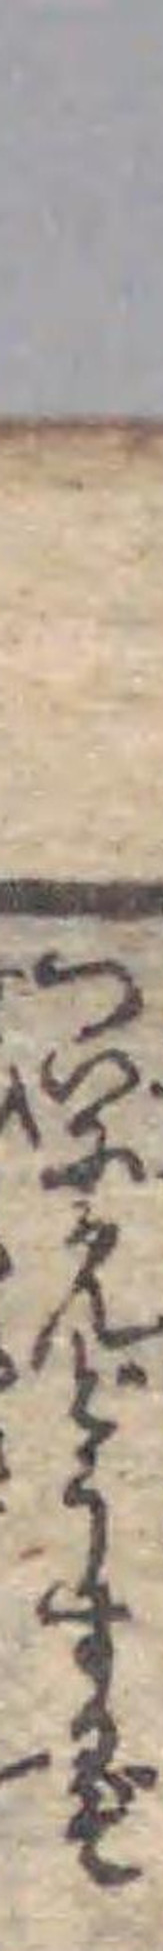ついにかんどうするぞ
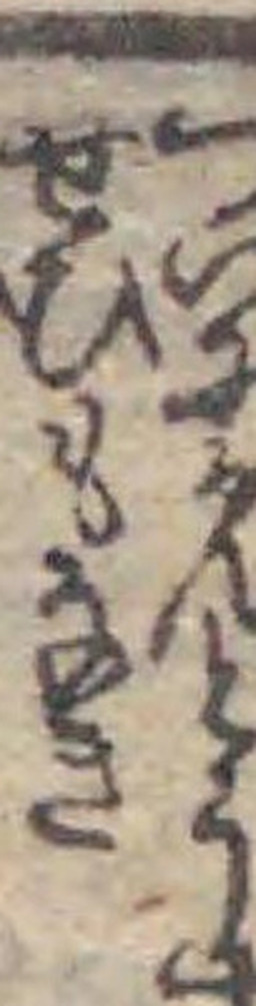せひもなき
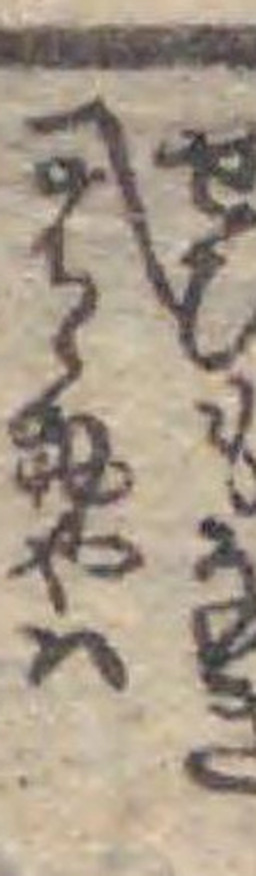〽はゝおやは
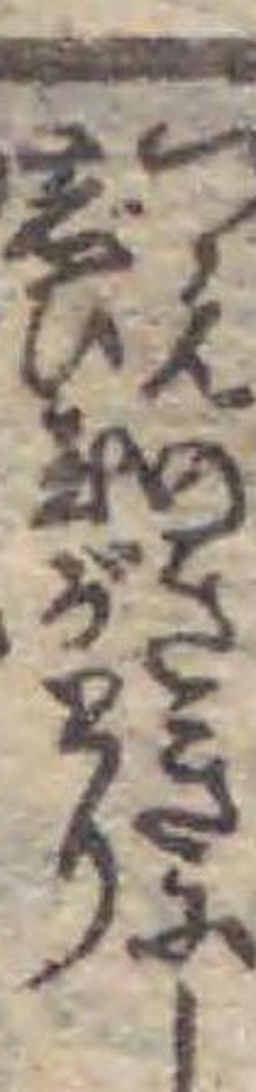じひ玉がとり
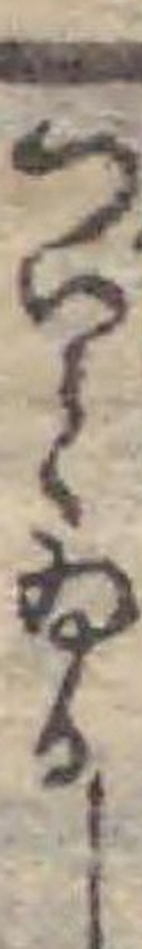ついてゐる
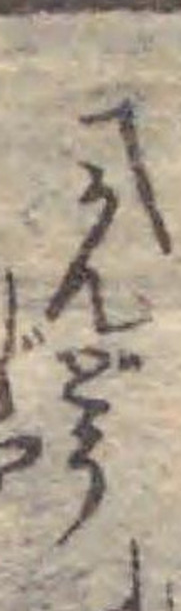〽かんどう
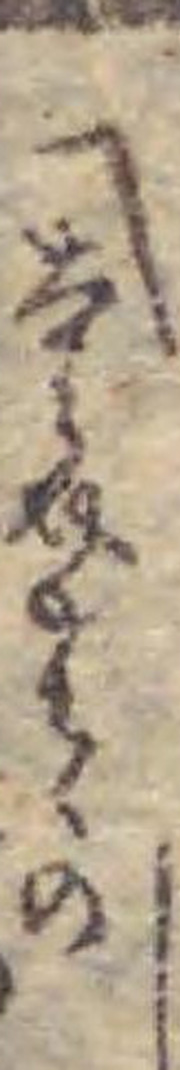〽太郎介はゝの
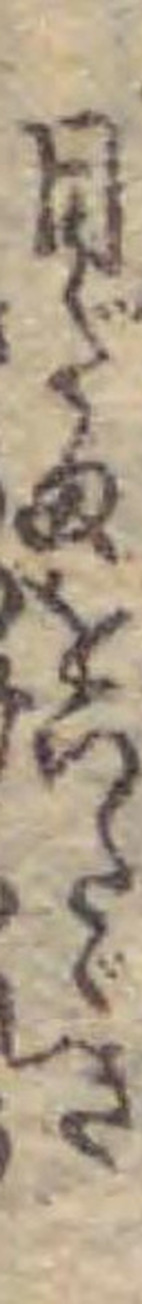目だまをいたゞき
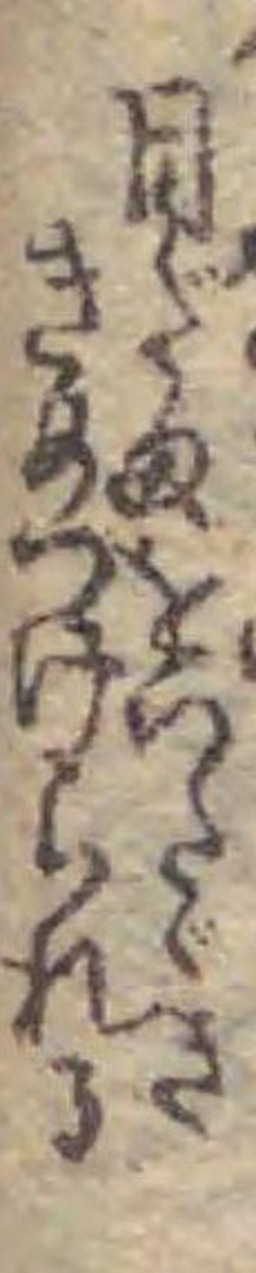きめつけられる
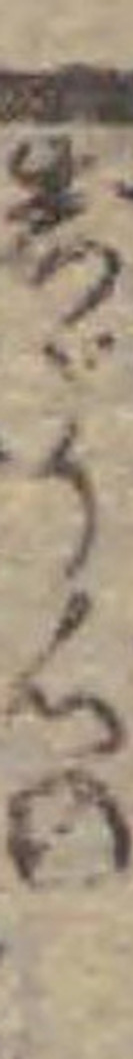しゞう心の
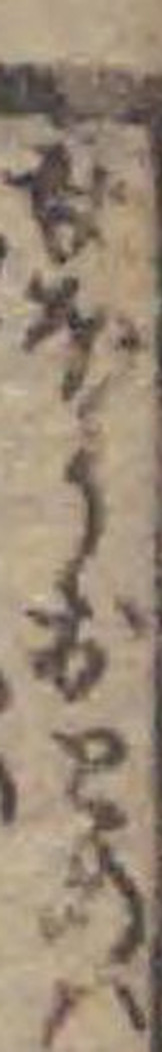女ほうおとめは
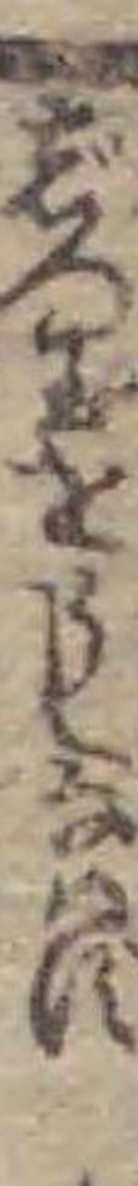じつ玉をうしなはず
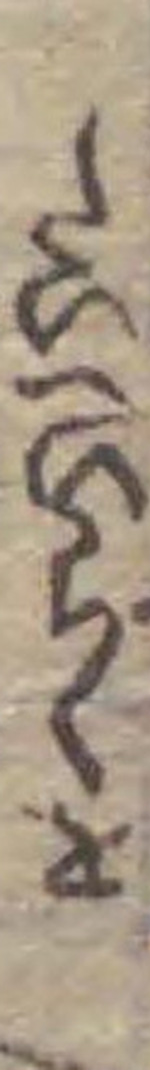たいへいらくを
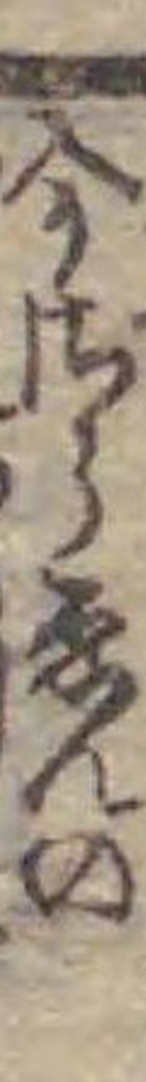今さらゑんの
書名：四遍搨心学草帋 : 3巻
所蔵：国立国会図書館 National Diet Library, JAPAN
